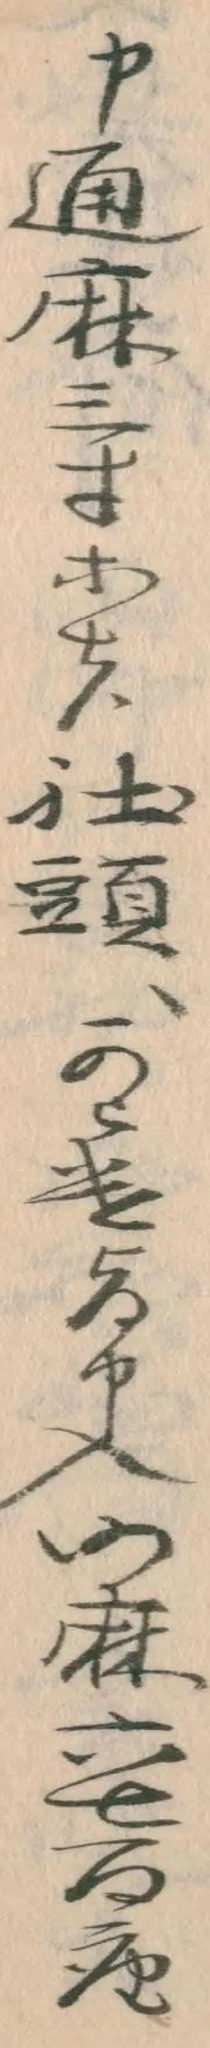申通麻三寸等は社頭へ可被遣旨申入仍麻六七百座
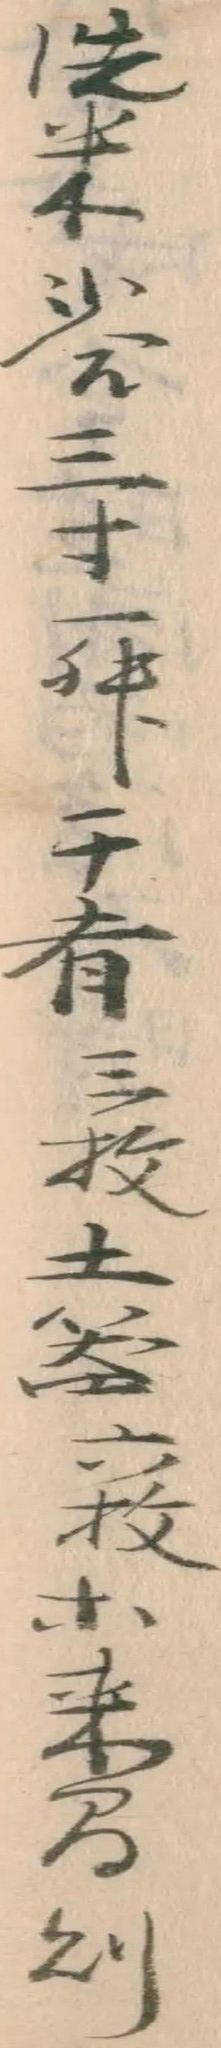洗米弐合三寸一升干肴三枚土器六枚等来間則
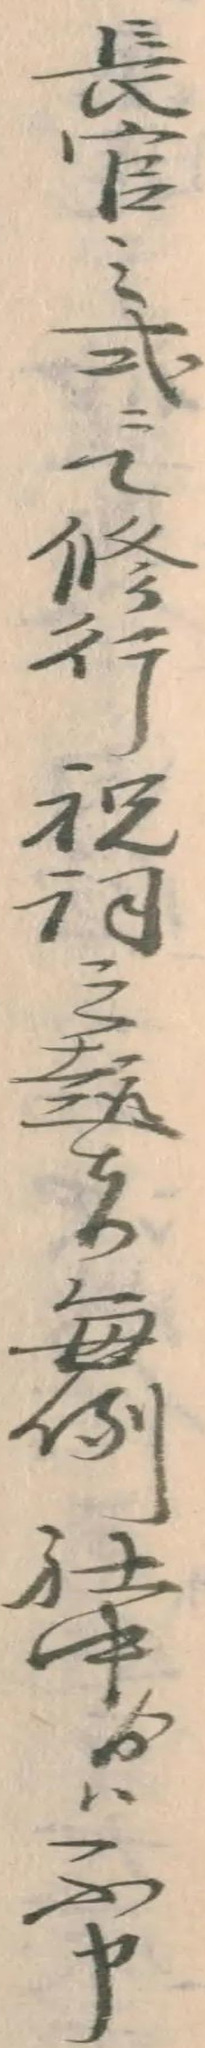長官之式ニて修行祝詞之趣は毎例社中ゟハ不申
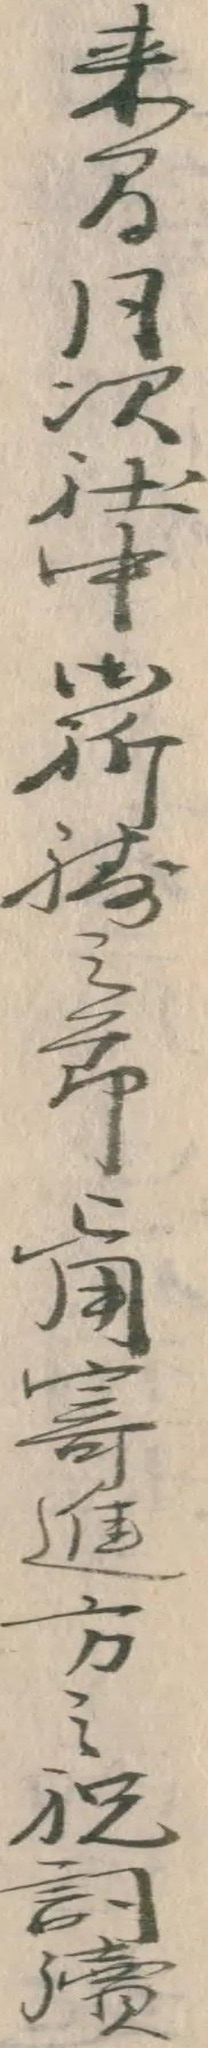来間月次社中御祈祷之節被用寄進方之祝詞讀
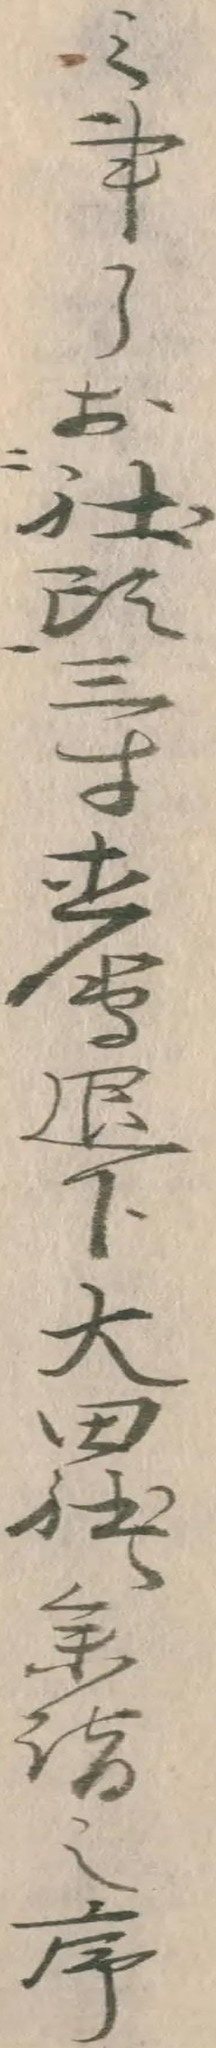之事了於社頭三寸直會退下大田社へ参詣之序
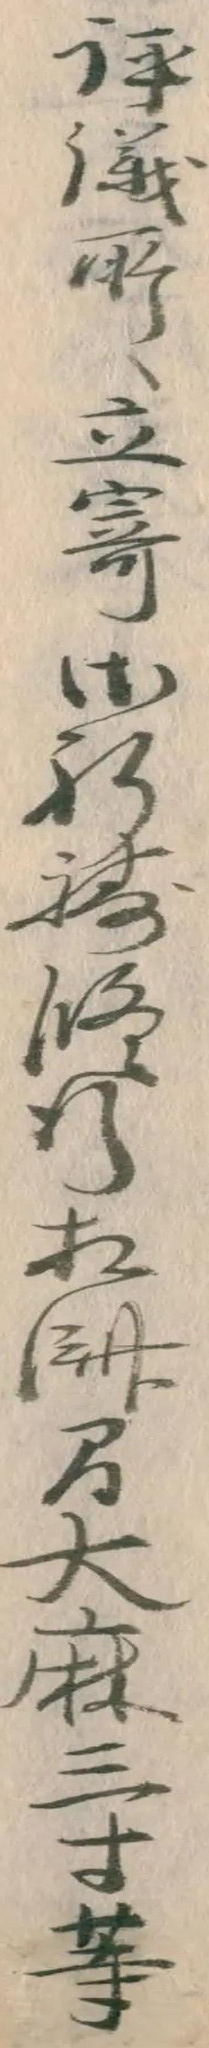評議所へ立寄御祈祷修行相済間大麻三寸等
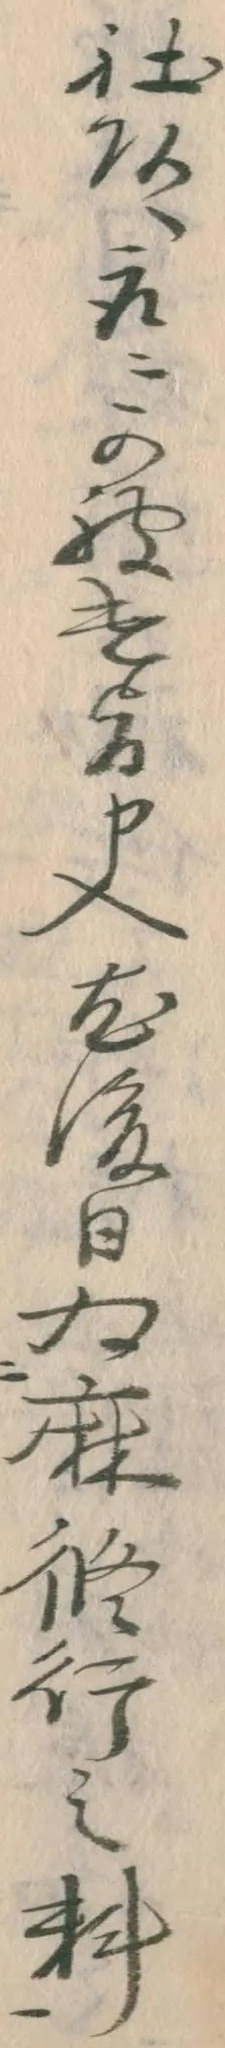社頭へ取ニ可致遣旨申入尤後日為麻修行之料
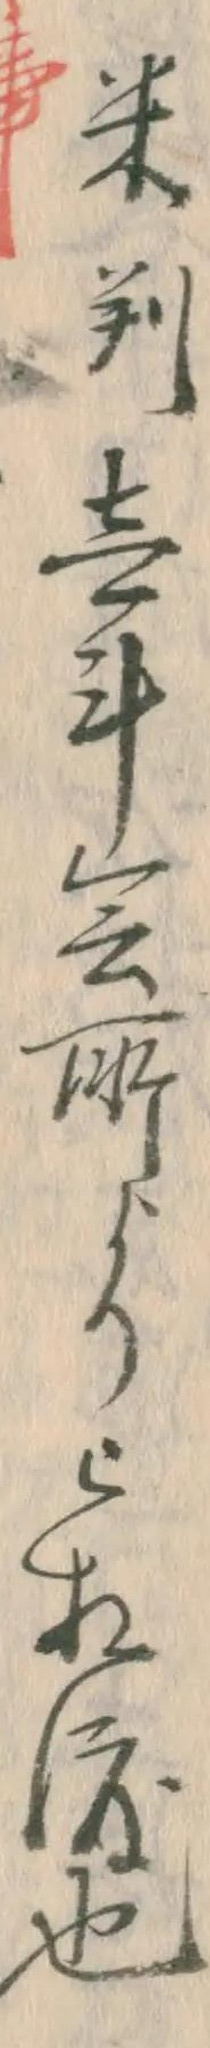米判壱斗会所より被相渡也
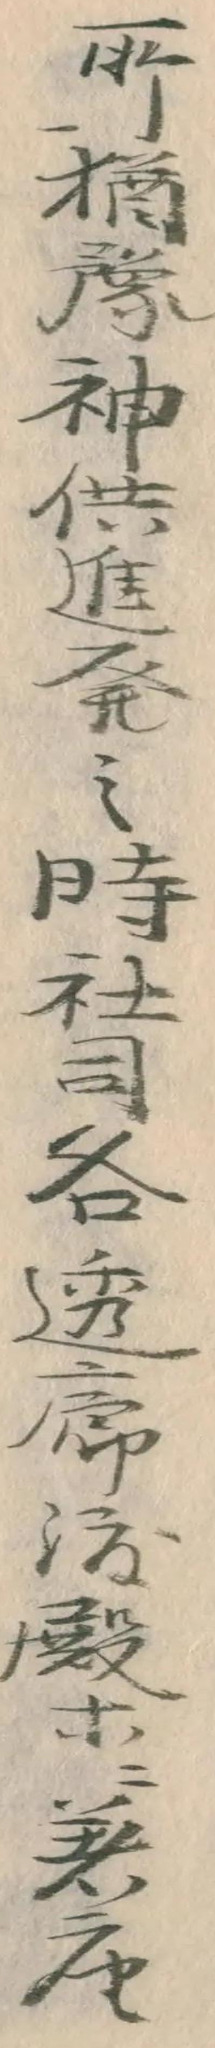所猶予神供進発之時社司各透席渡殿等ニ着座
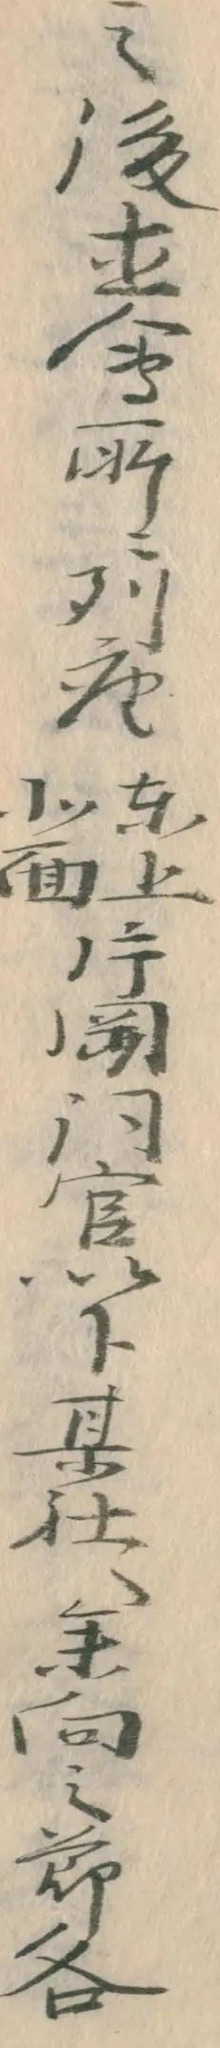之後直會所ニ列座東上北面片岡祠官以下某社へ参向之節各

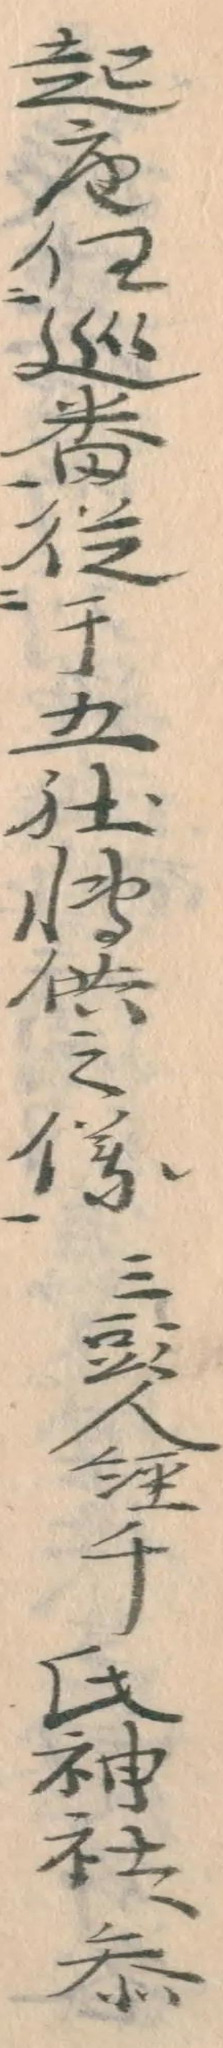起座任巡番従于五社転供之儀三頭人経千氏神社へ参
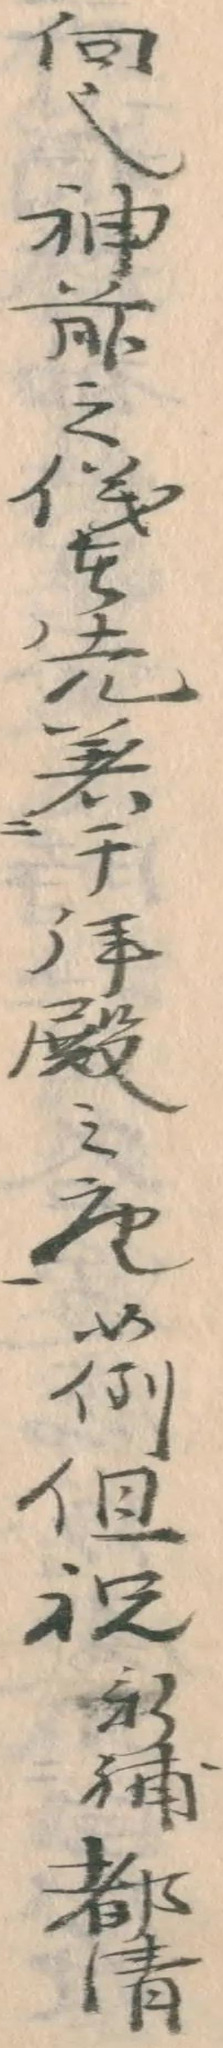向也神前之儀者先着于拝殿之座如例但祝新補都清
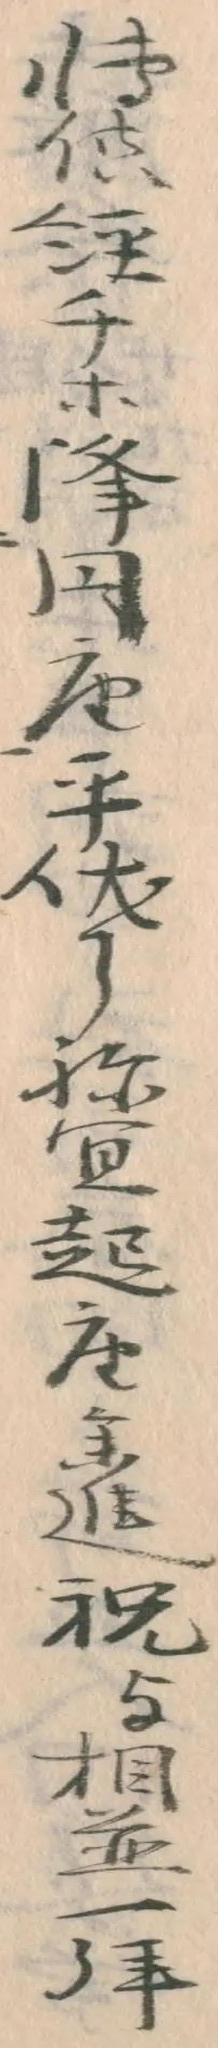轉供経千等降円座平伏了称宜起座参進祝と相並一拝
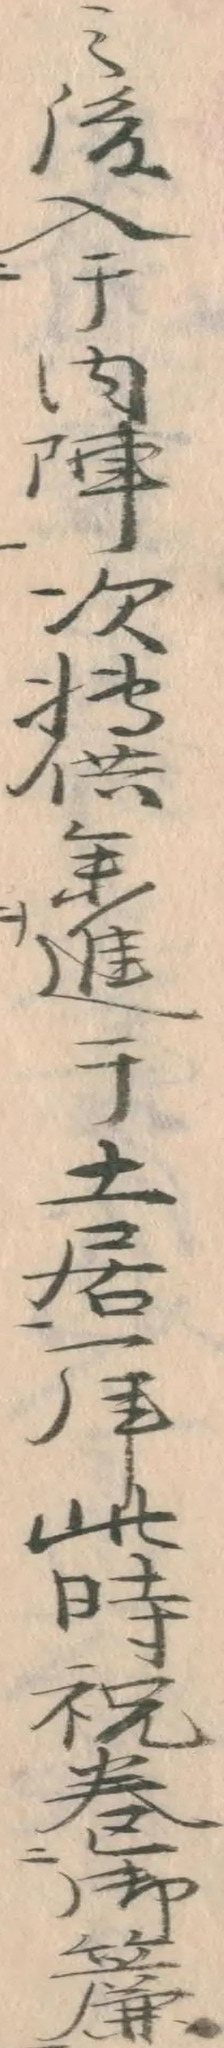之後入于内陣次転轉参進于土居此一拝此時祝巻御簾
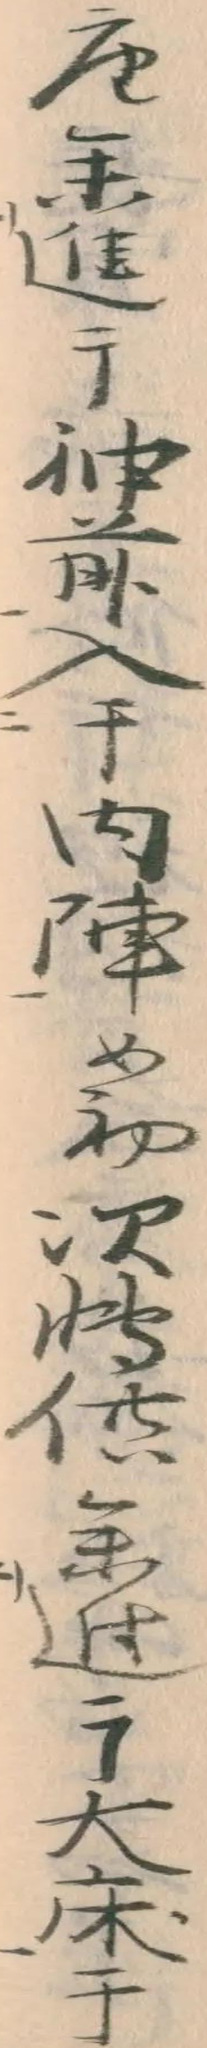座参進于神前入于内陣如初次轉供参進于大床于
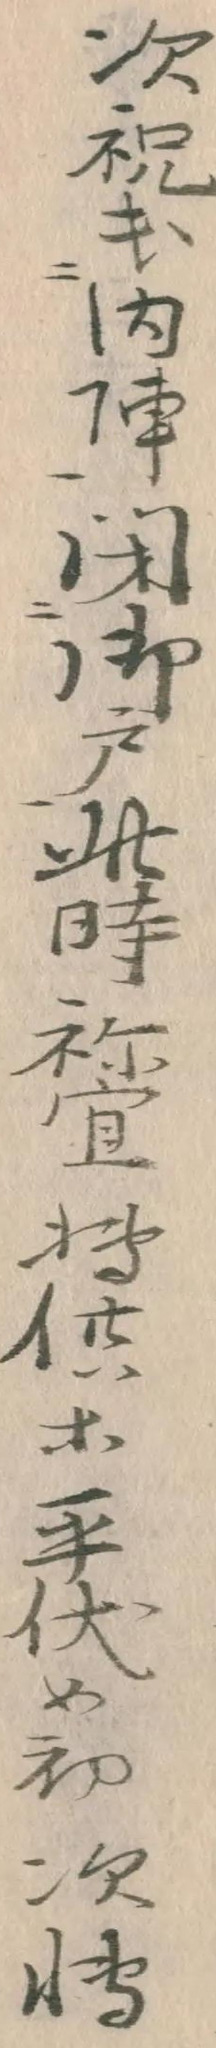次祝出内陣閉御戸此時称宜轉供等平伏如初次轉
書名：賀茂社記録. 第72冊
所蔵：国立国会図書館 National Diet Library, JAPAN
